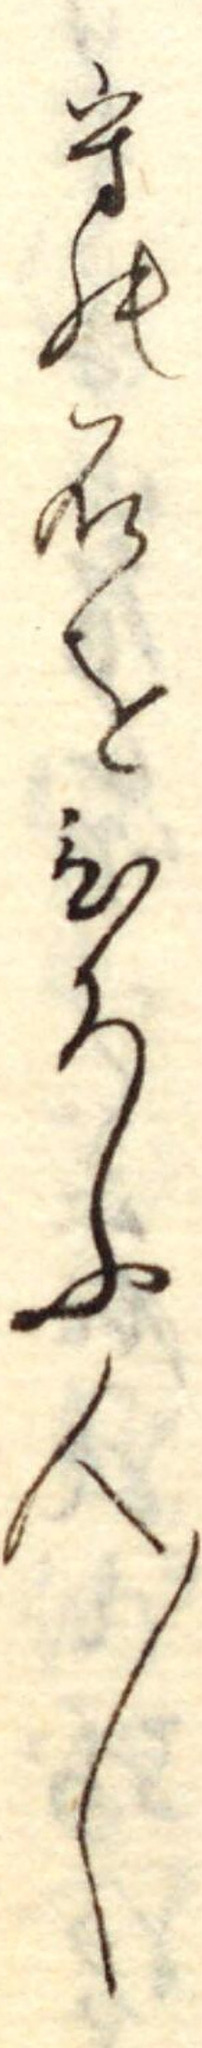守の石をひろふ人〳〵
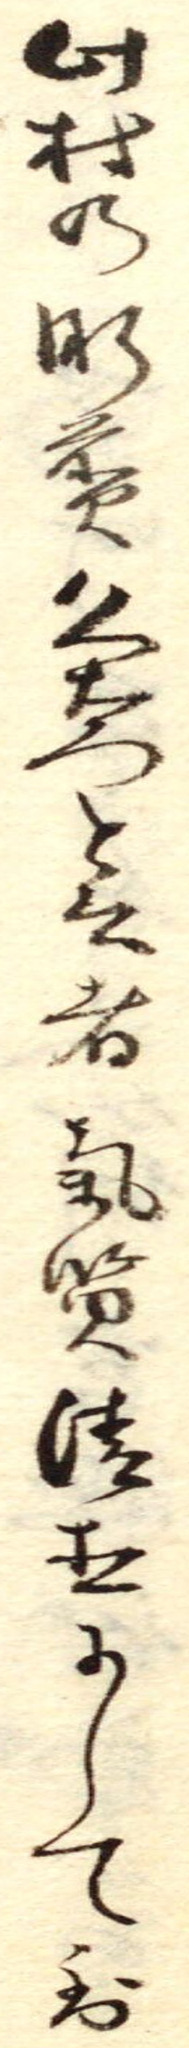此村の肝煎久右衛門と云者気質清直にして到
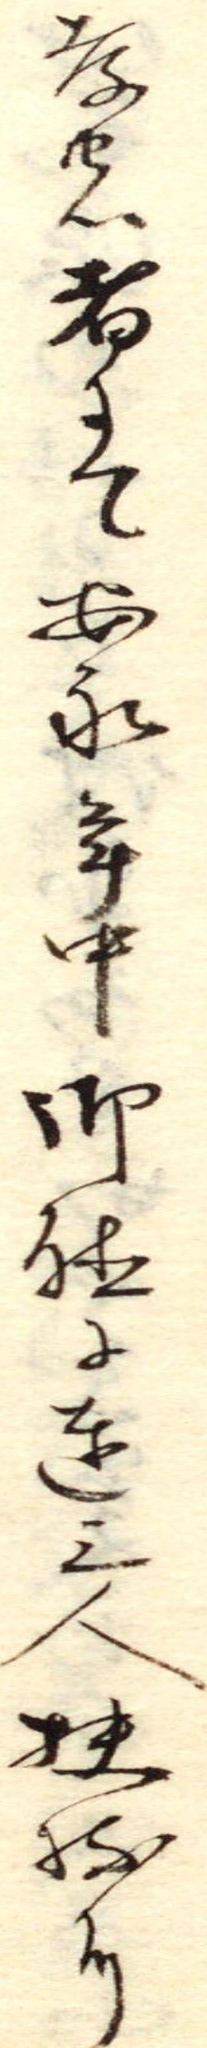孝の者にて安永年中御聴に達三人扶持に
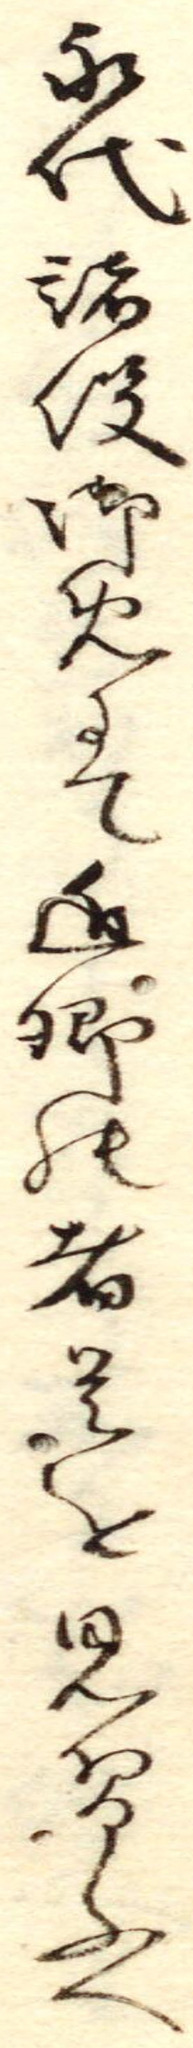永代諸役御免にて近郷の者是を見習ふへ
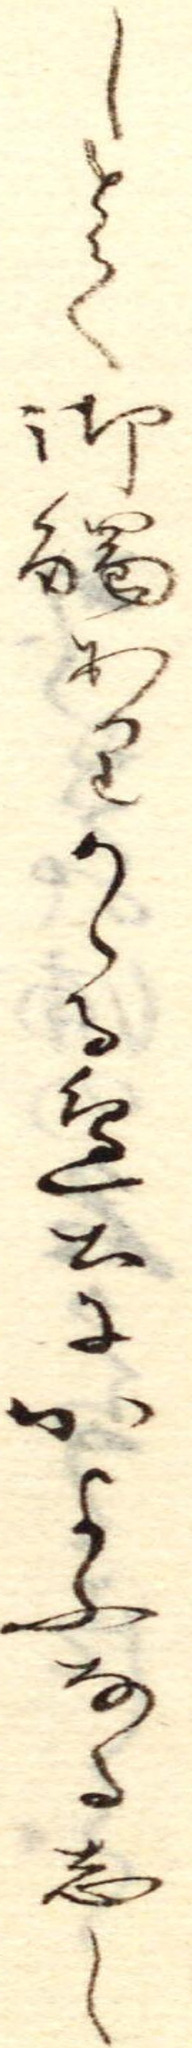しとて御触ありかゝる辺土にかよふなる志し
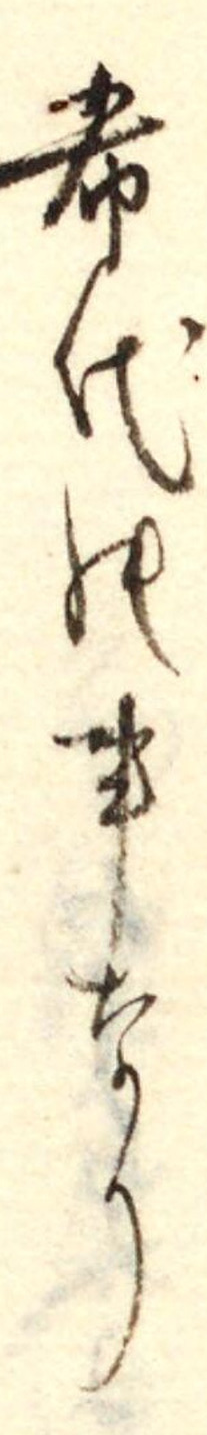希代の事なり
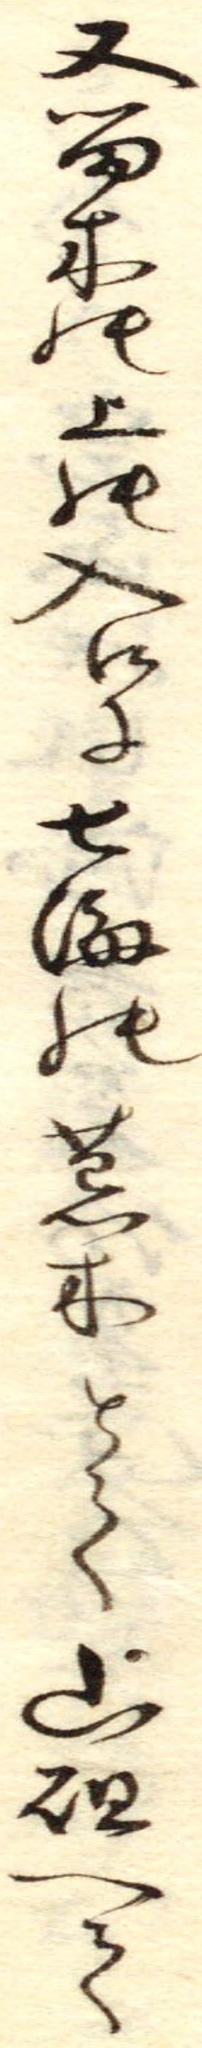又留木の上の入口に七海の荒木とて山岨へて
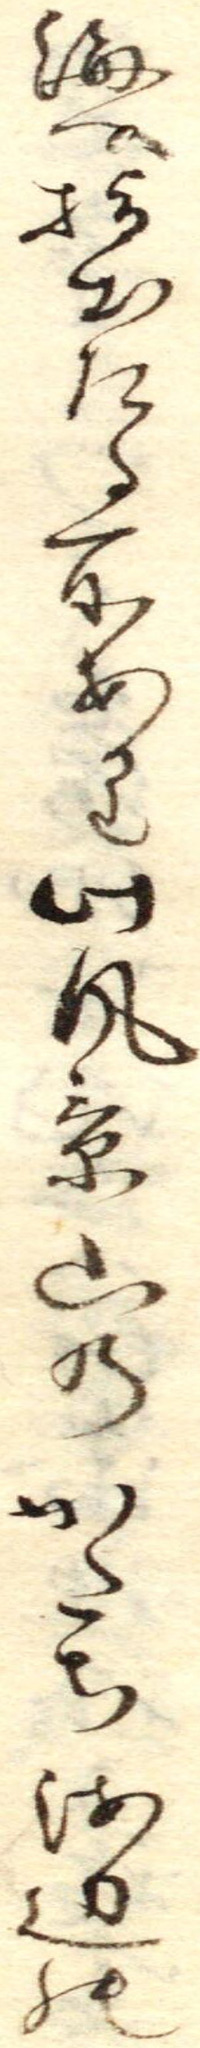海へ指出たる所あり此風景山のかたち海辺の
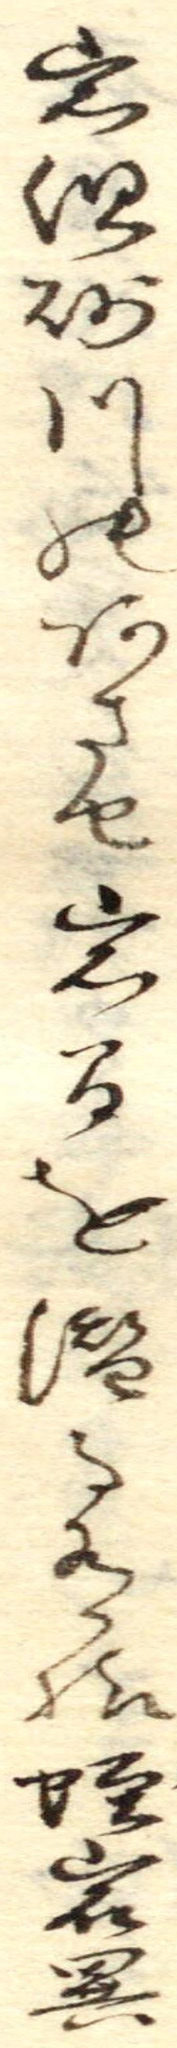岩側砂川のあさせ岩間を潜る有様蛙岩異

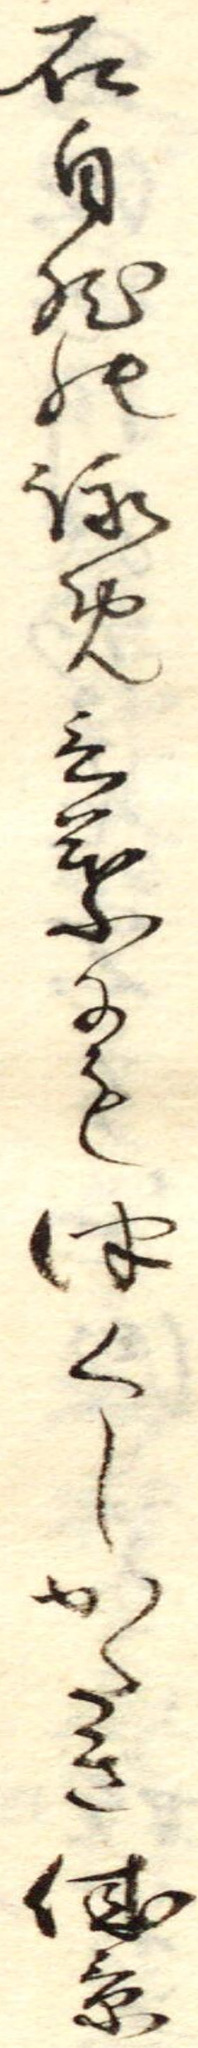石自然の詠め言葉にもつくしかたき体景
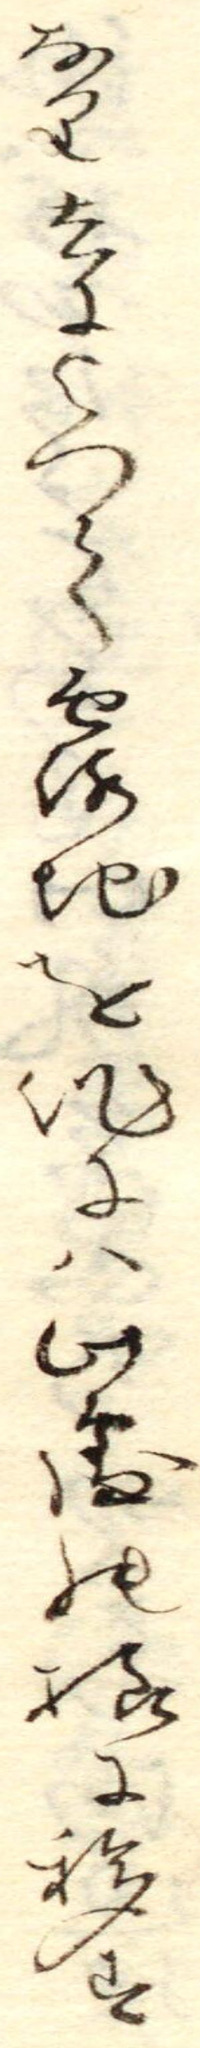なり去によつて露地を作には此処の様に移す
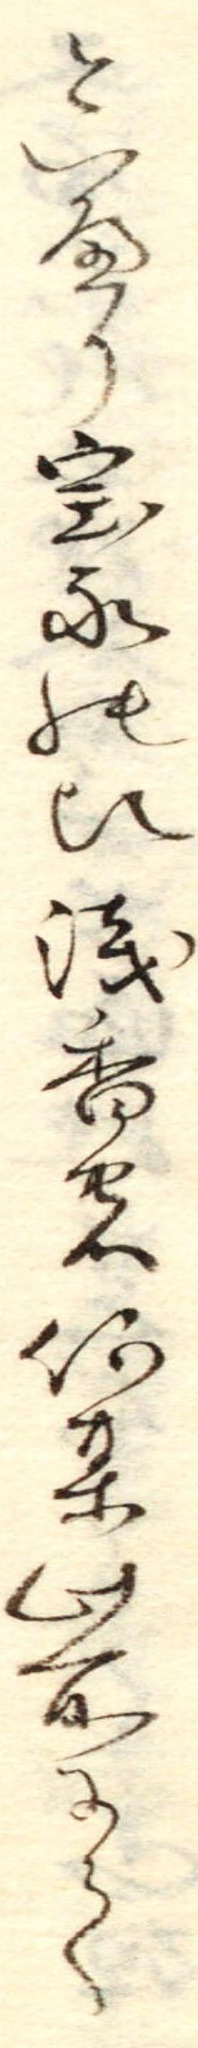といへり宝永の比浅香の何某此所に
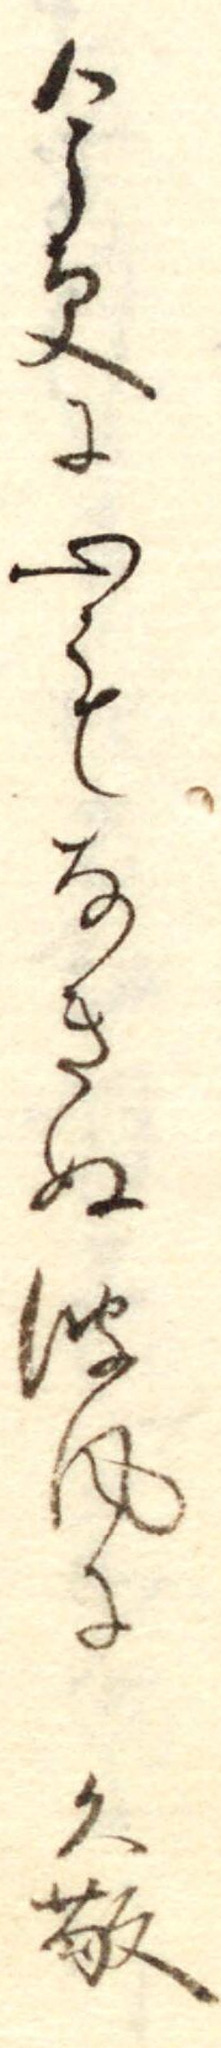今更に心もなきぬ波風に久敬
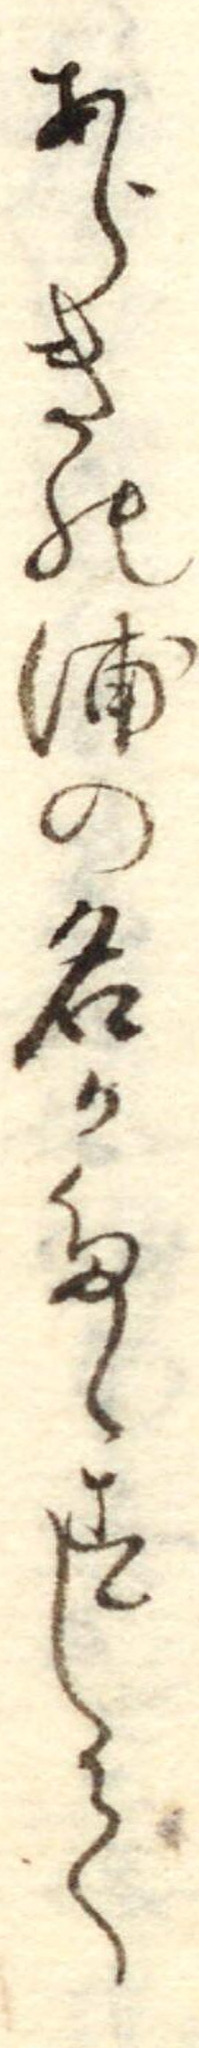あらきの浦の名かたゝすして
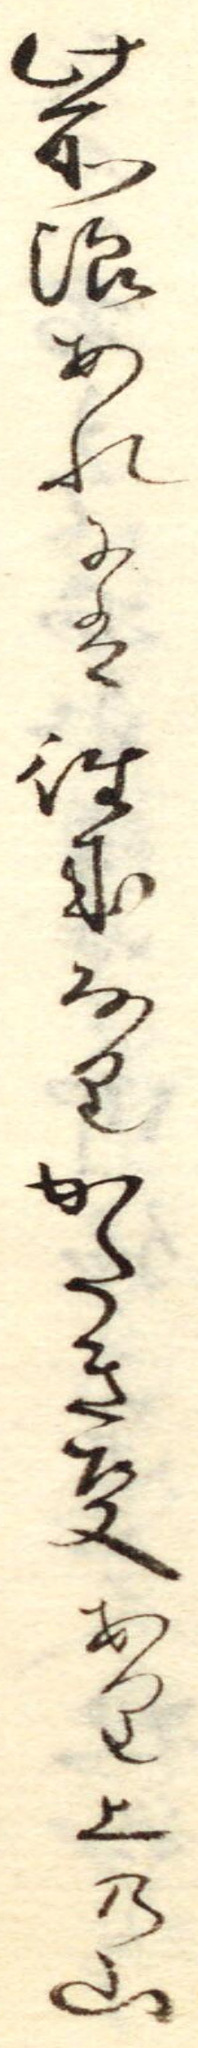此所浪あれには往来なりかたき事あり上の山
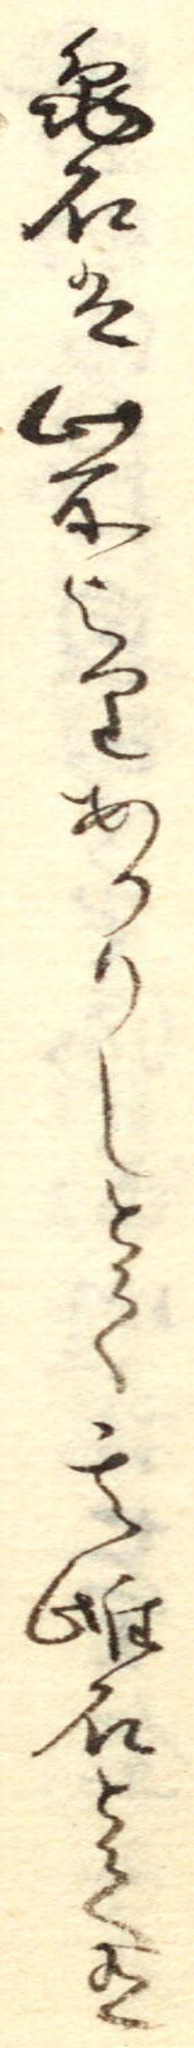亀石は此所よりあかりしとて其雌石とて有
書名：能登名跡誌
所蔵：Ishikawa Prefectural Library
